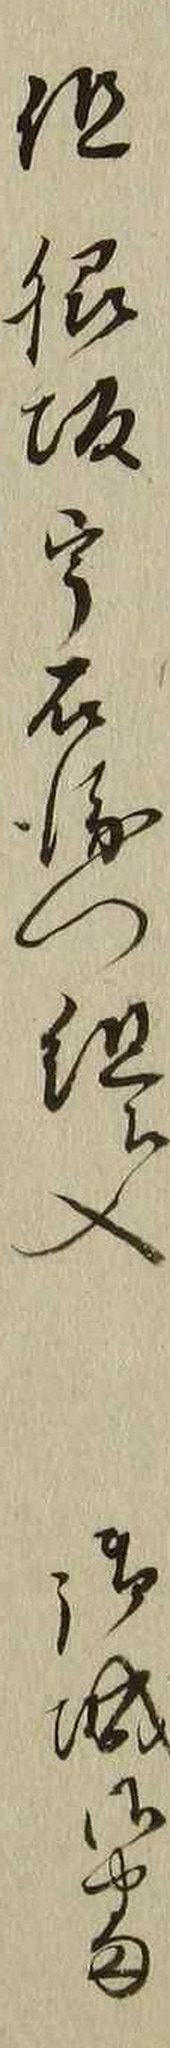但脇坂宇右衛門組江入御城御番
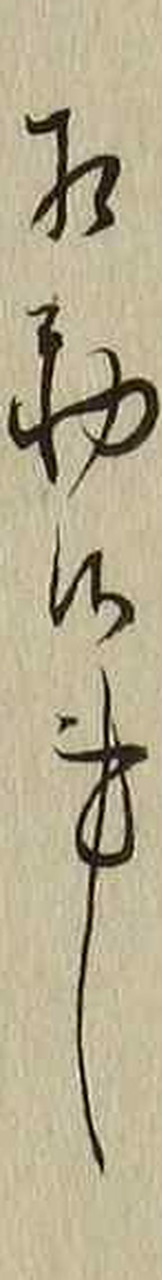相勤候事
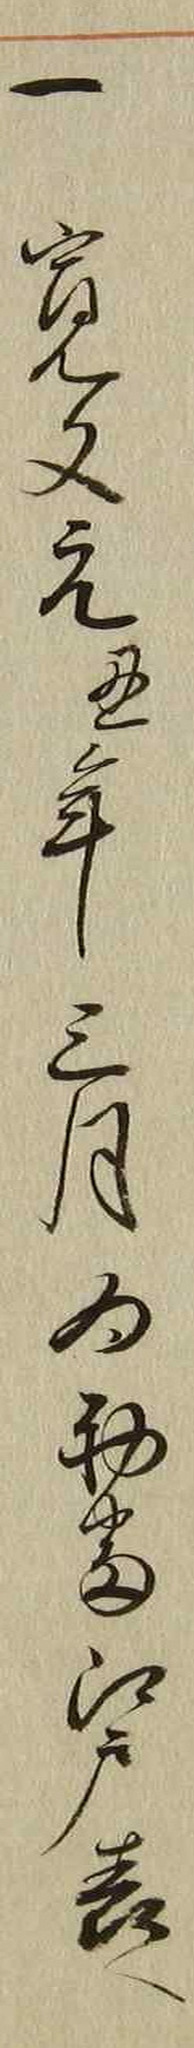一寛文元丑年三月為勤番江戸表ヘ
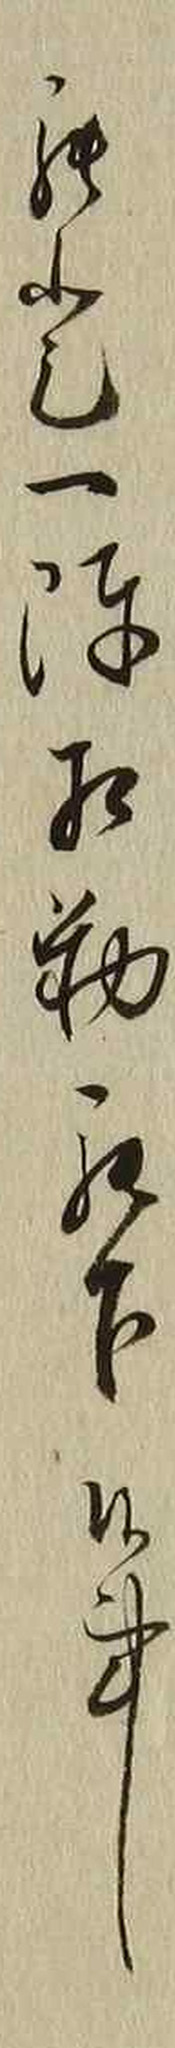罷登一陣相勤罷下候事
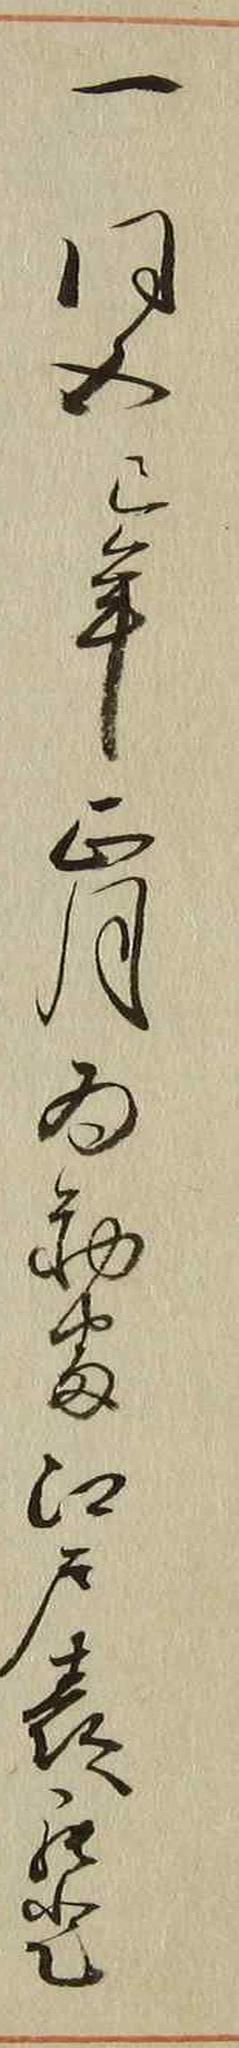一同五巳年正月為勤番江戸表ヘ罷登
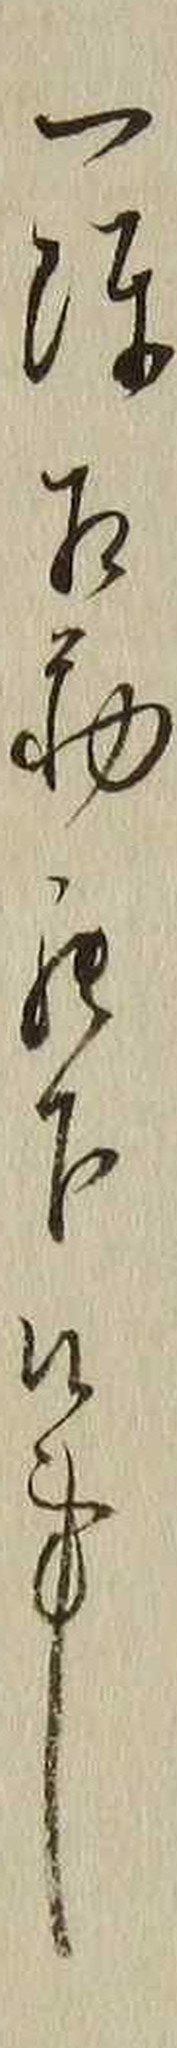一陣相勤罷下候事
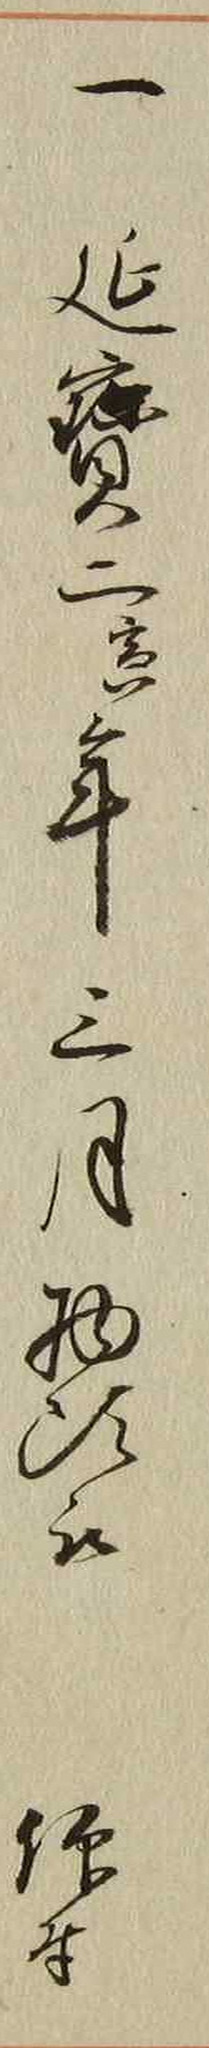一延宝二寅年三月物頭被仰付
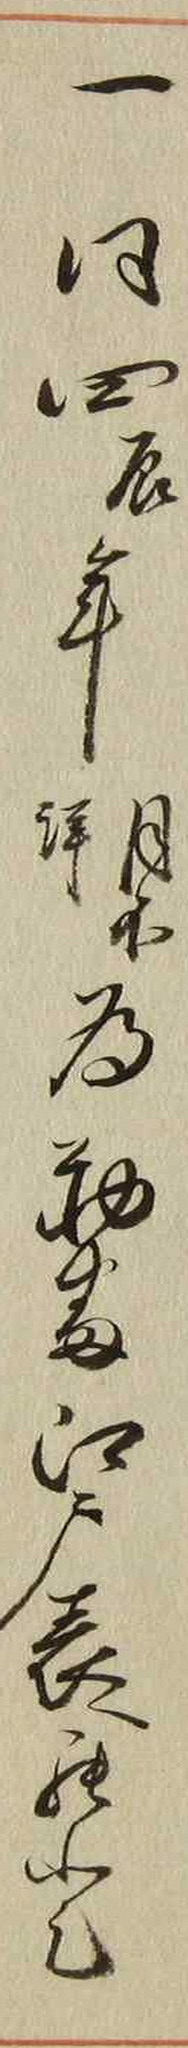一同五巳年正月為勤番江戸表ヘ罷登
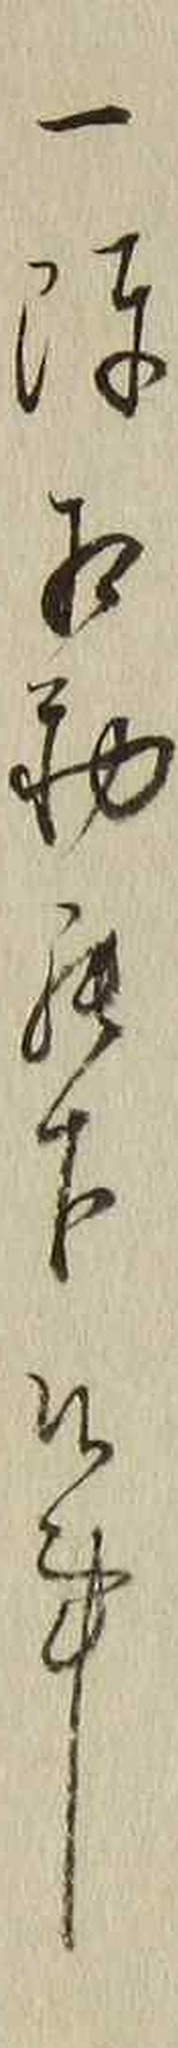一陣相勤罷下候事
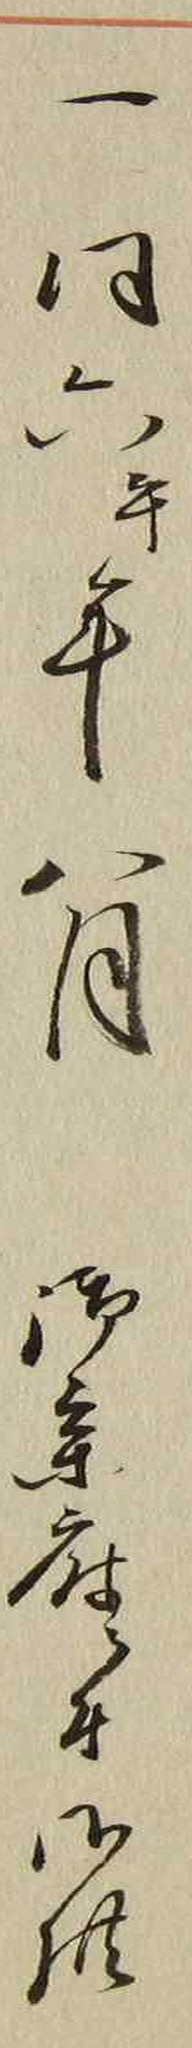一同六午年八月御参府ニ付御供
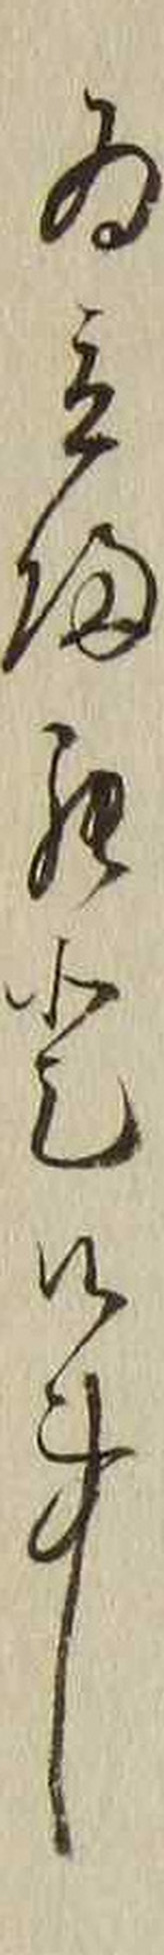為立帰罷登候事
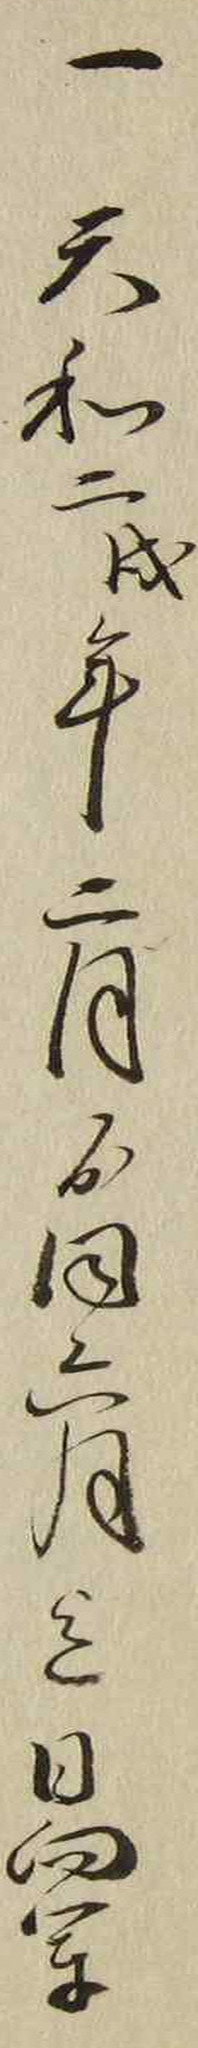一天和二戌年二月ゟ同六月迄日向軍
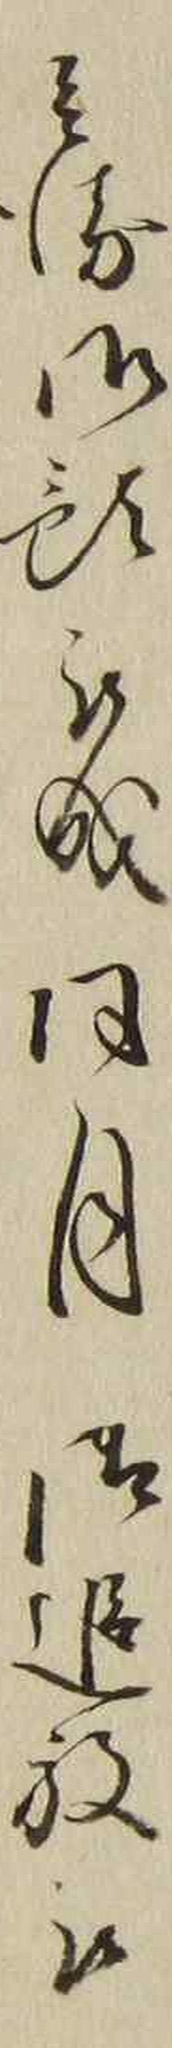兵衛御預被成同月御追放被

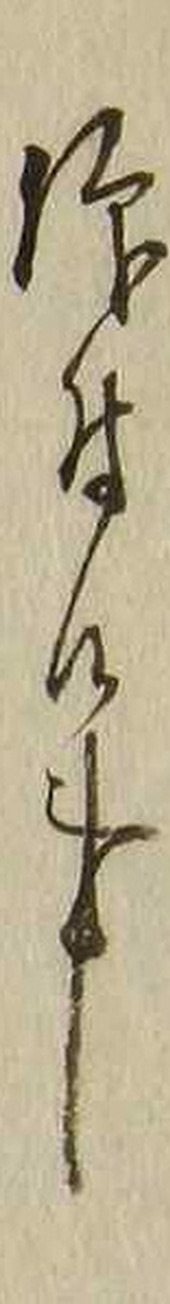仰付候事
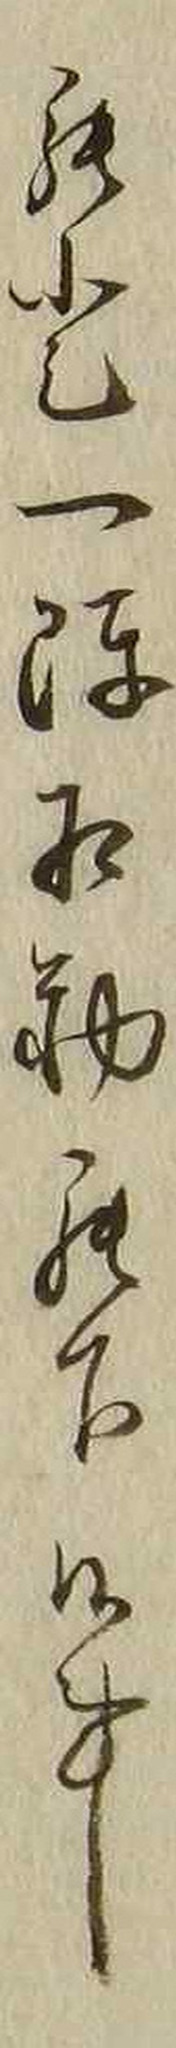罷登一陣相勤罷下候事
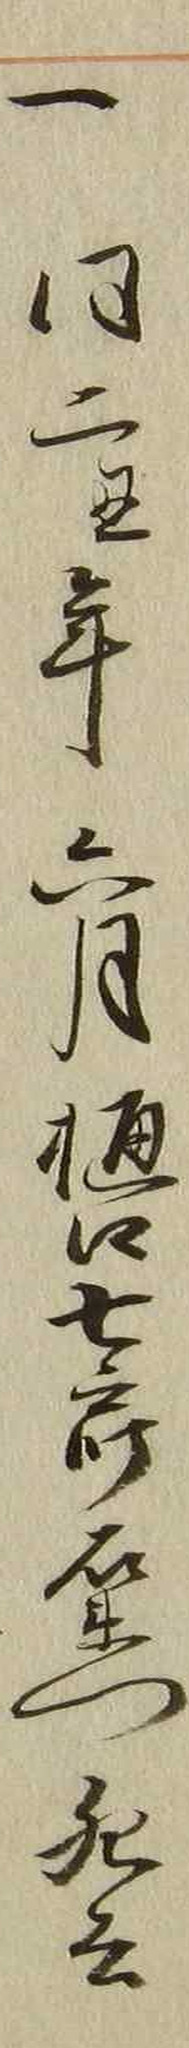一同二丑年六月樋口七郎右衛門死去
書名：諸士系譜　巻之68　を之部2
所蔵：会津若松市立会津図書館
